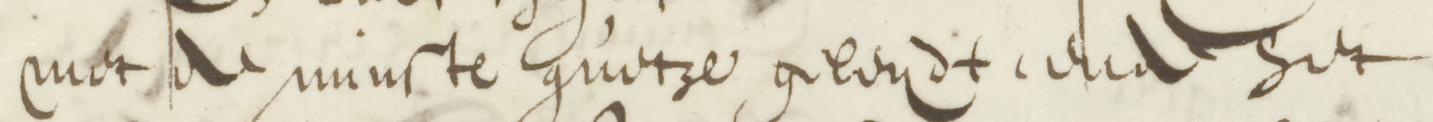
met de minste quetze geleydt, ende het
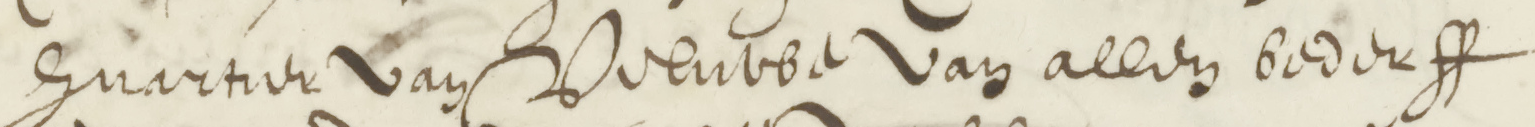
quartier van Veluwe van allen bederff
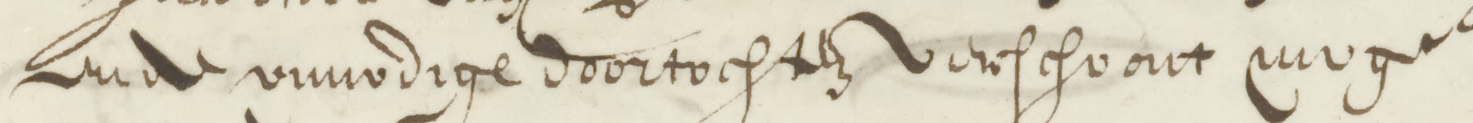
ende onodige doortochten verschoont moge
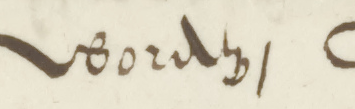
worden.
